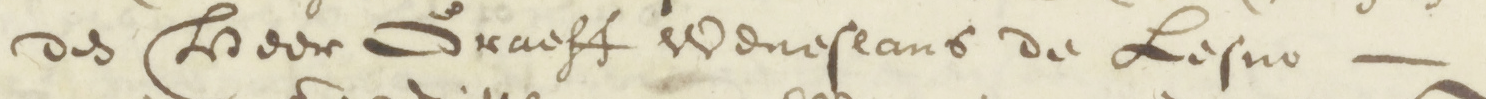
den Heer Graeff Weneslaus de Lesno —
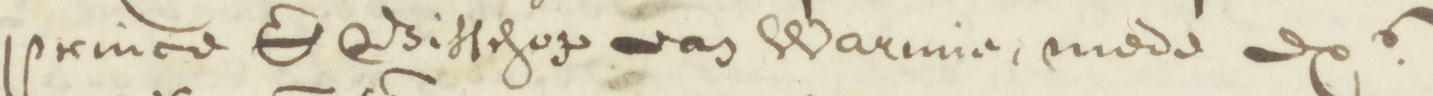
Prince & Bisschop van Warmie, mede Exs.
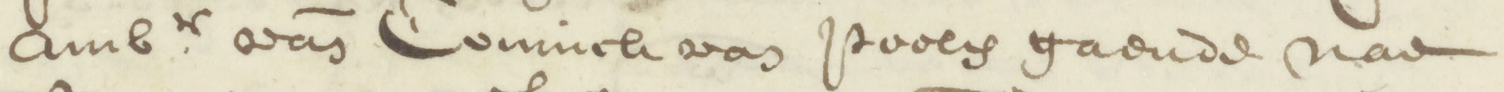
Ambr. van Coninck van Poolen gaende nae
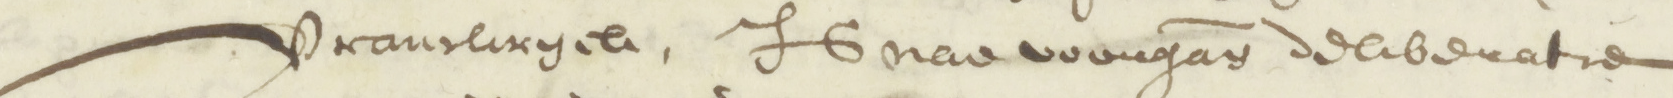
Vranckryck. Is nae voorgaen deliberatie
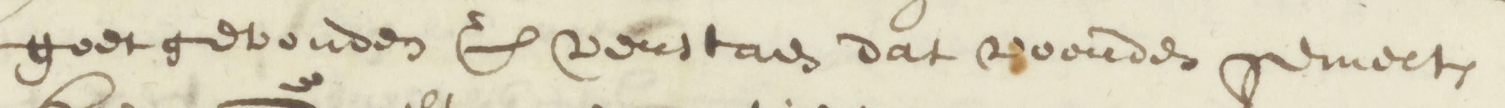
goetgevonden & verstaen dat voorden gemelte
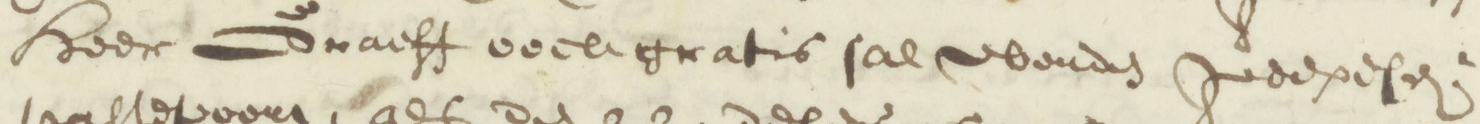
Heer Graef oock gratis sal worden gedepescht
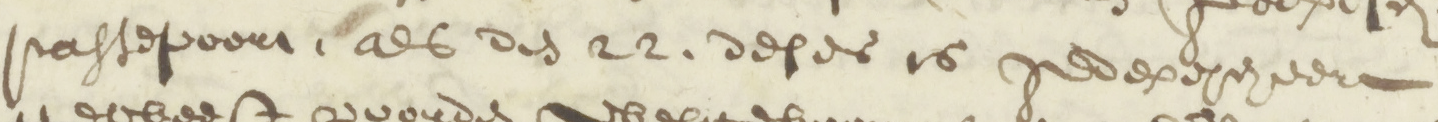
passepoort, als den 22. deses is gedepescheert
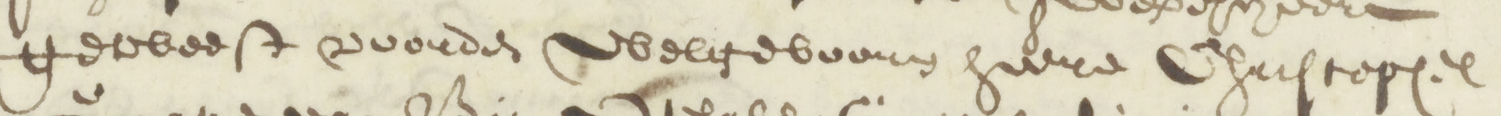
geweest voorden welgebooren heere Christophel
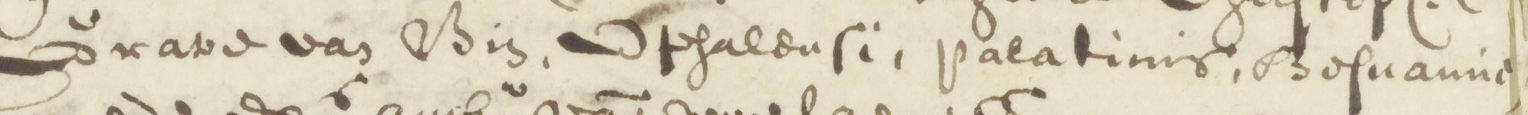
Grave van Bin, Ophalensi, Palatinis, Besnanue
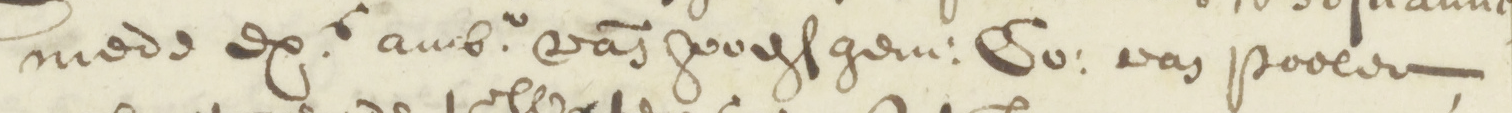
mede exs. ambr. van hoogh gem: Co: van Poolen,
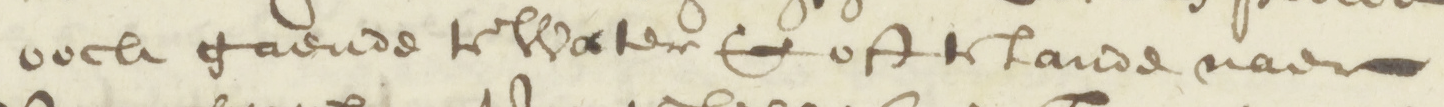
oock gaende te Water & off te Lande naer
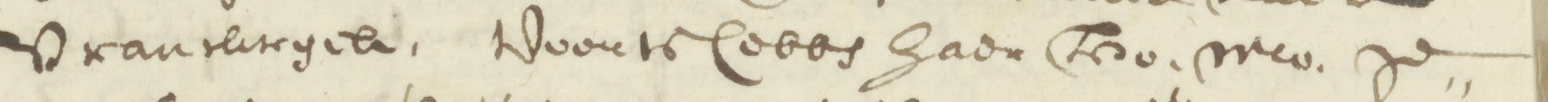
Vranckryck. Voorts hebben haer Ho.Mo. ge„
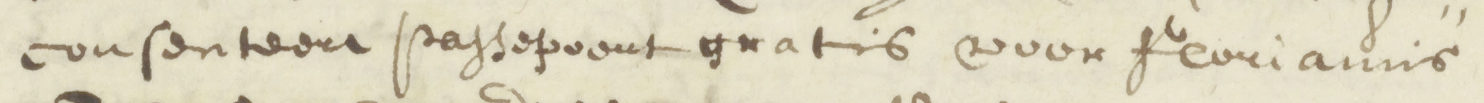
consenteert passepoort gratis voor Florianus
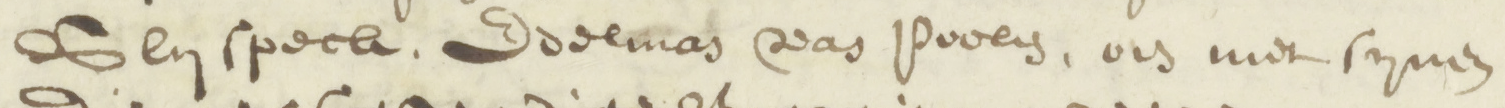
Slyspeck, Edelman van Poolen, om met sijnen
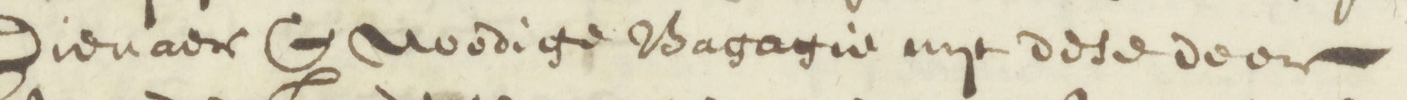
Dienaer & Noodige Bagagie uijt dese door
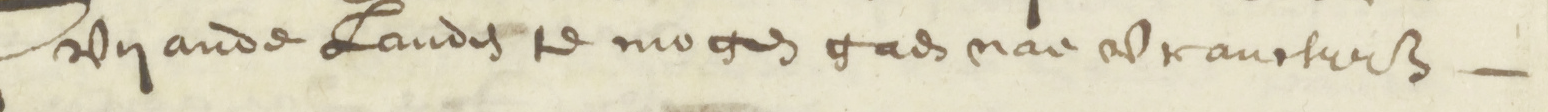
Vijande Landen te mogen gaen nae Vranckr ¬
